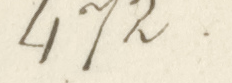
472
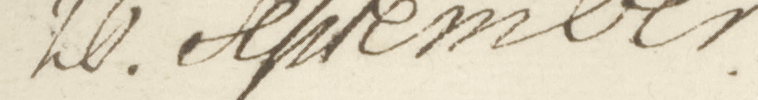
20. September.
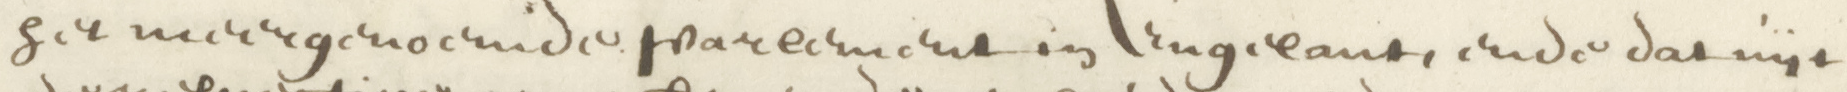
het meergenoemde parlement in Engelant, ende dat uijt
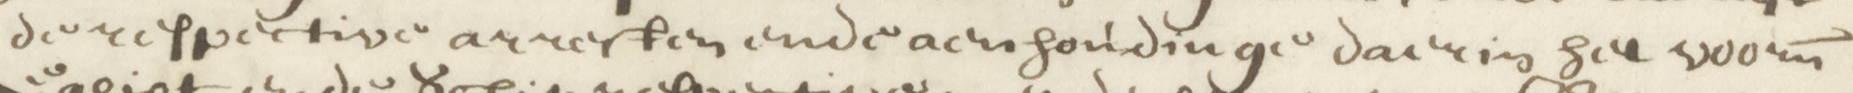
de respective arresten ende aenhoudinge daerin het voorn
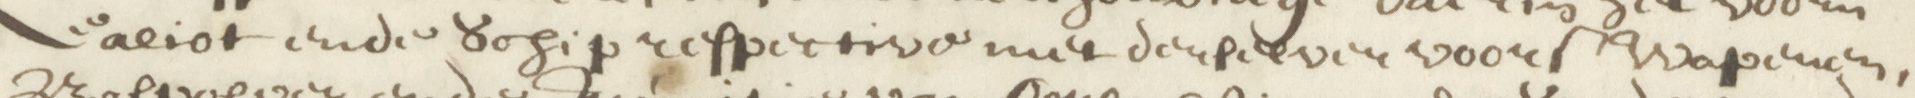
Galiot ende Schip respective met derselver voors Wapenen,
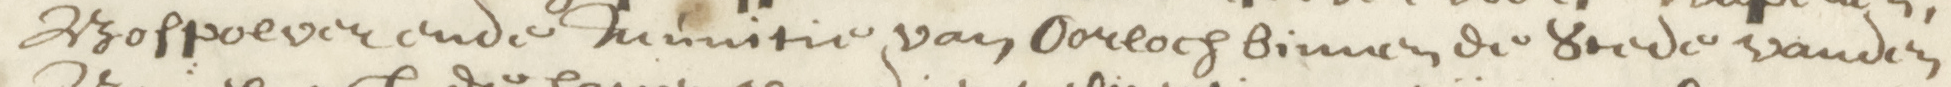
Bospolver ende Munitie van Oorloch binnen de Stede vanden
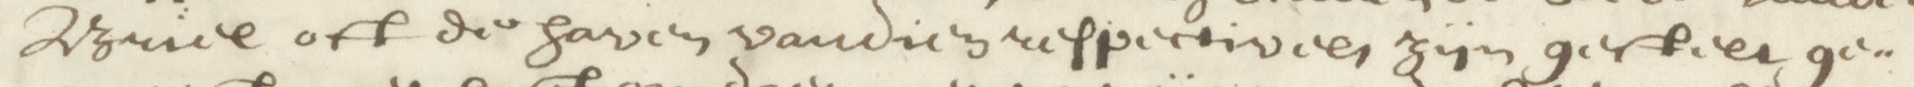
Briel off de haven vandien respectivel zijn gestelt ge,,
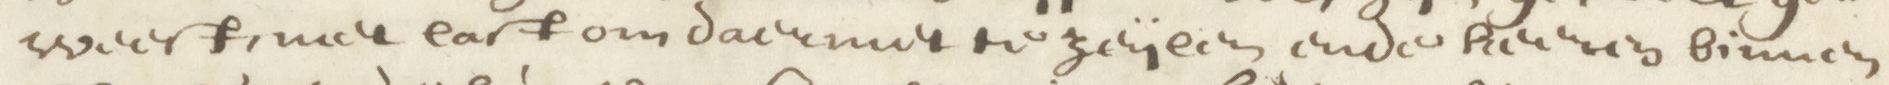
weest, met last om daermet te zeijlen ende keeren binnen
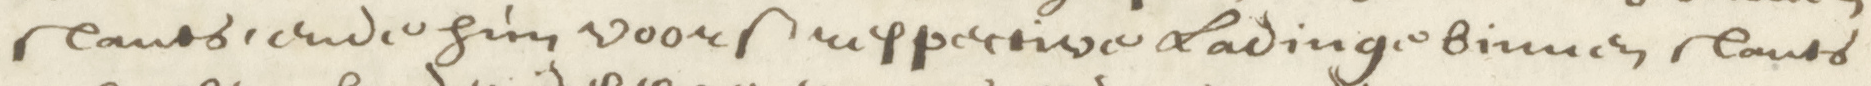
slants, ende hun voors respective Ladinge binnen slants
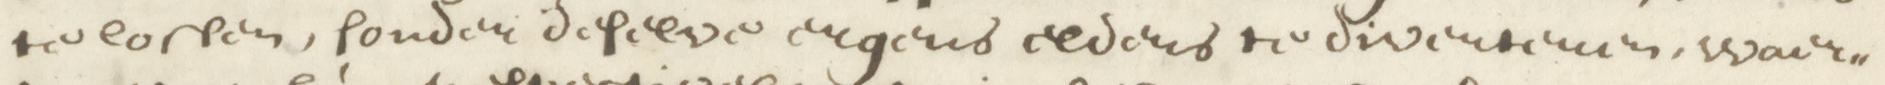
te lossen, sonder deselve ergens elders te diverteren, waer,,
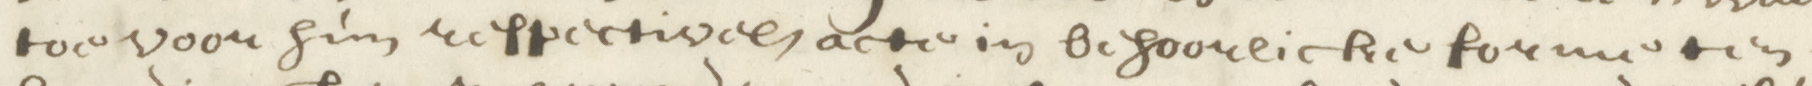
toe voor hun respectivel acte in behoorlicke forme ten
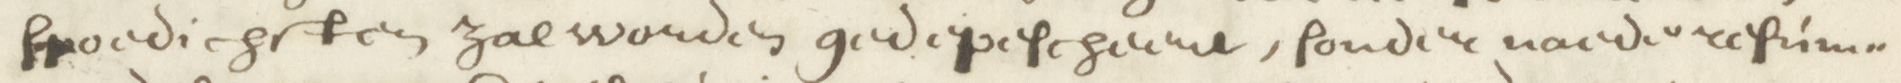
spoedichsten zal worden gedepescheert, sonder naede resum,,
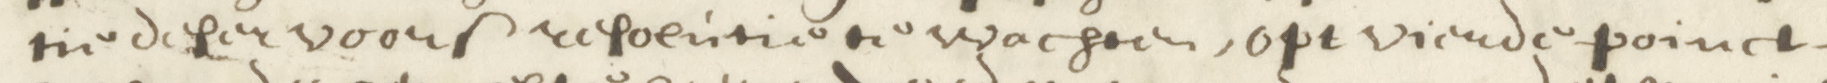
tie deser voors resolutie te wachten, opt vierde poinct
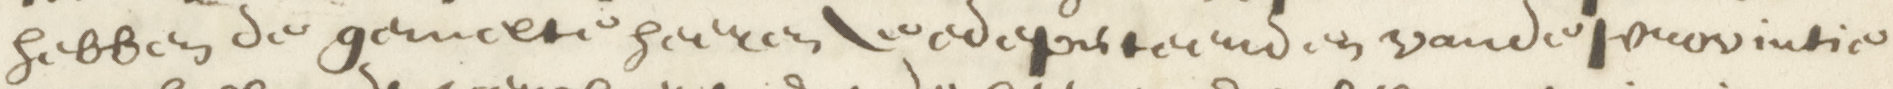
hebben de gemelte heeren Gedeputeerden vande Provintie
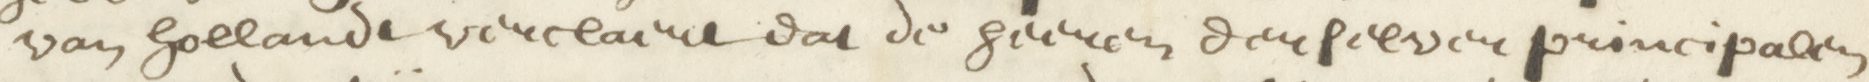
van hollandt verclaert dat de heeren derselver principalen
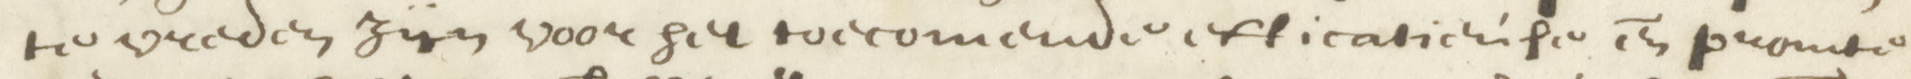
te vreden zijn voor het toecomende efficatieuse en promte
